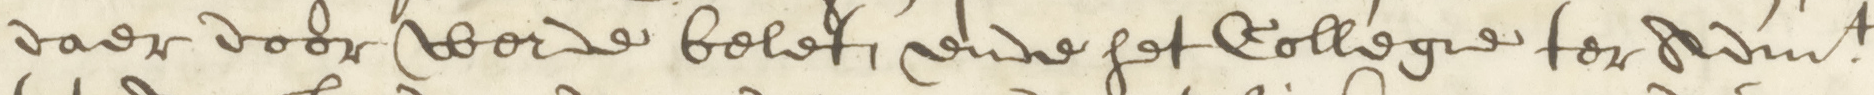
daer door werde belet, ende het Collegie ter Admt.
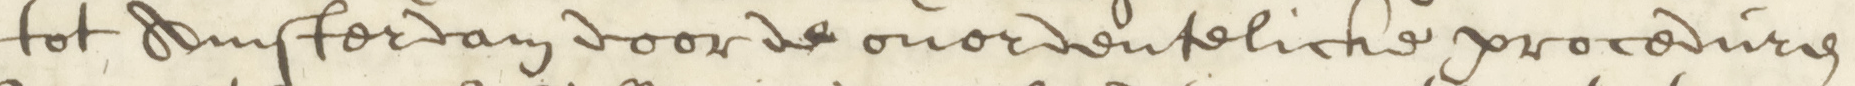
tot Amsterdam door de onordentelicke proceduren
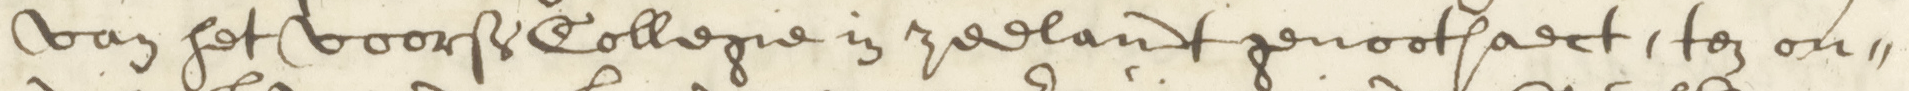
van het voorss. Collegie in zeelandt genootsaect, ten on„
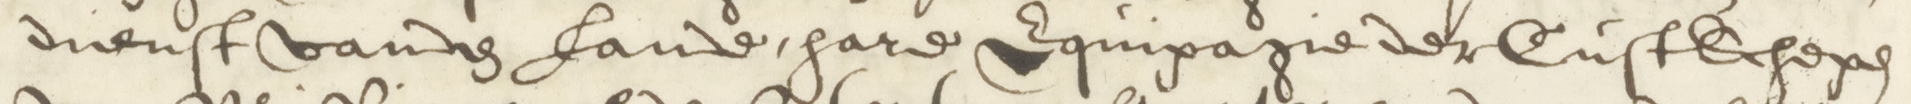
dienst vanden Lande, hare Equipagie der CustSchepen
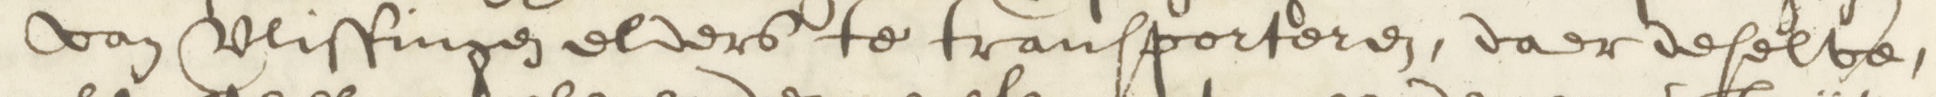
van Vlissingen elders te transporteren, daer deselve,
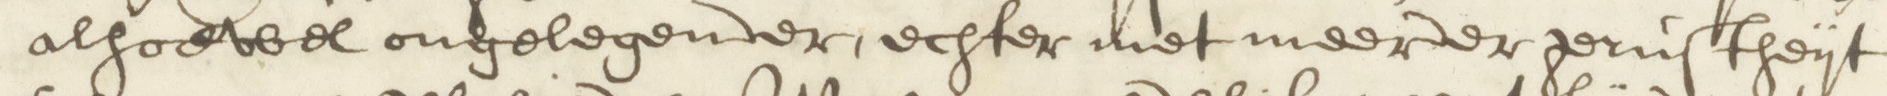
alhoewel ongelegender, echter met meerder gerustheijt
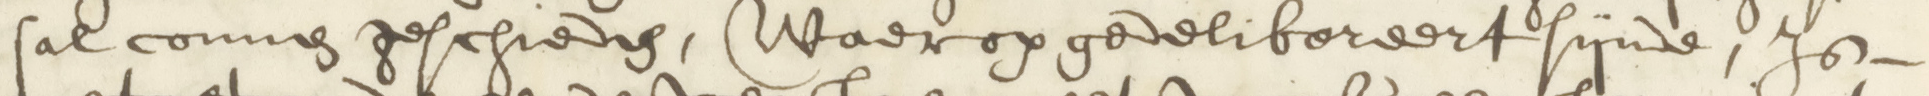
sal connen geschieden. Waerop gedelibereert sijnde, Is —
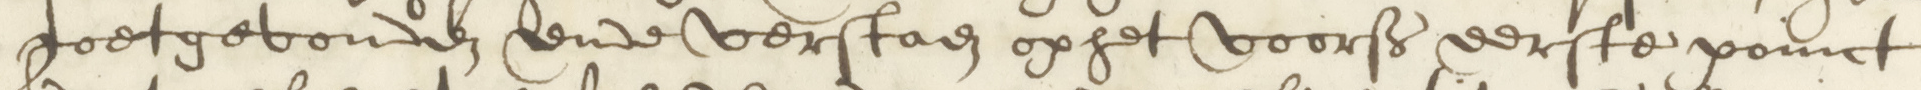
goetgevonden ende verstaen op het voorss. eerste poinct
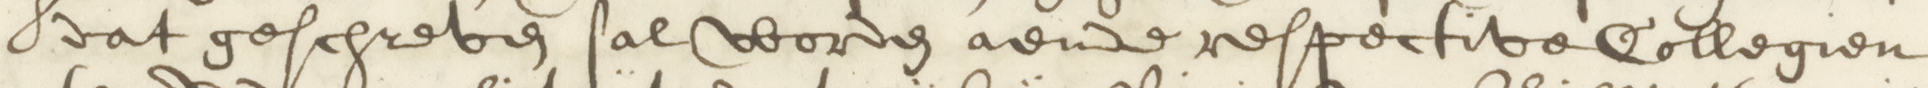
dat geschreven sal worden aende respective Collegien
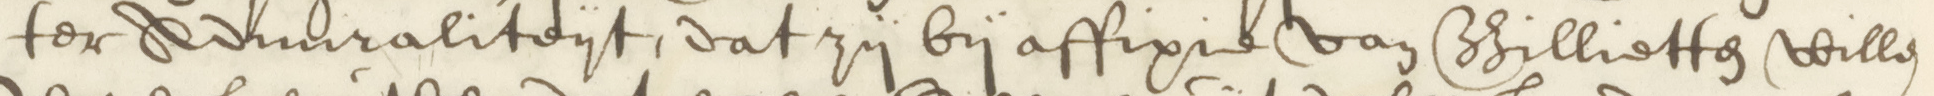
ter Admiraliteijt, dat zij bij affixie van Billietten willen
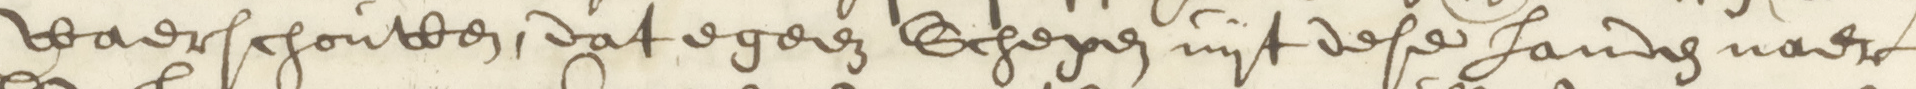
waerschouwen, dat egeen Schepen uijt dese Landen naer
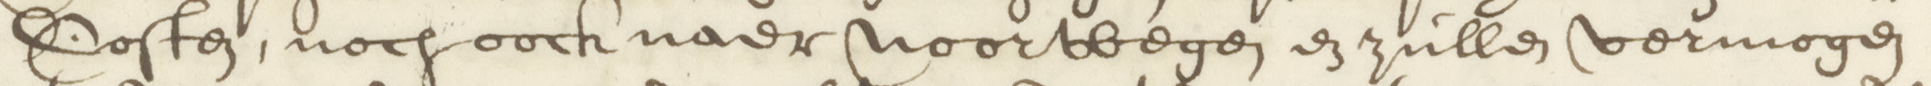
Oosten, noch oock naer Noorwegen en zullen vermogen
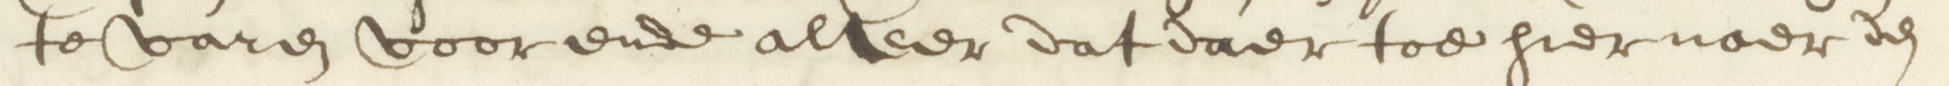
te varen voor ende alleer dat daer toe hier naer den
